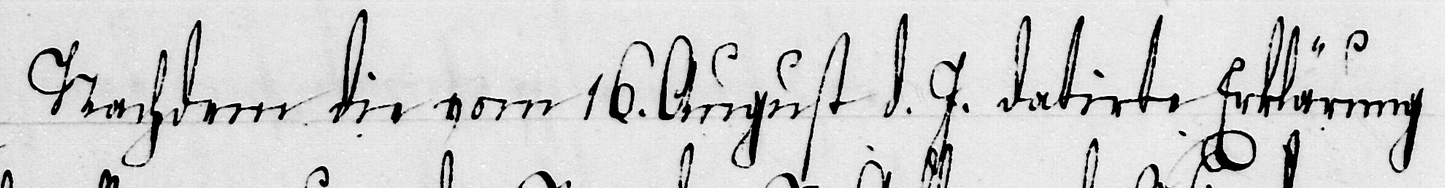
Nachdem die vom 16. August d. J. datirte Erklärung
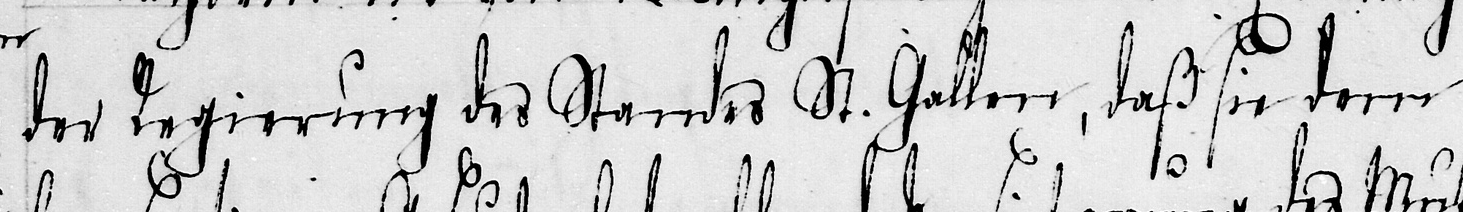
der Regierung des Standes St. Gallen, daß sie dem
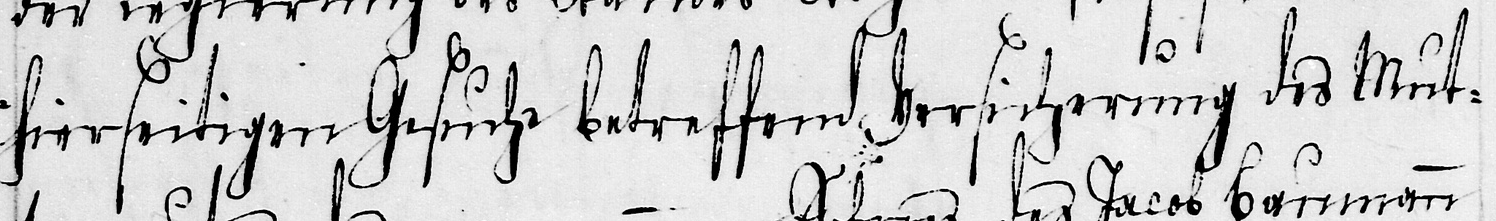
hierseitigen Gesuche betreffend Versicherung des Mut¬
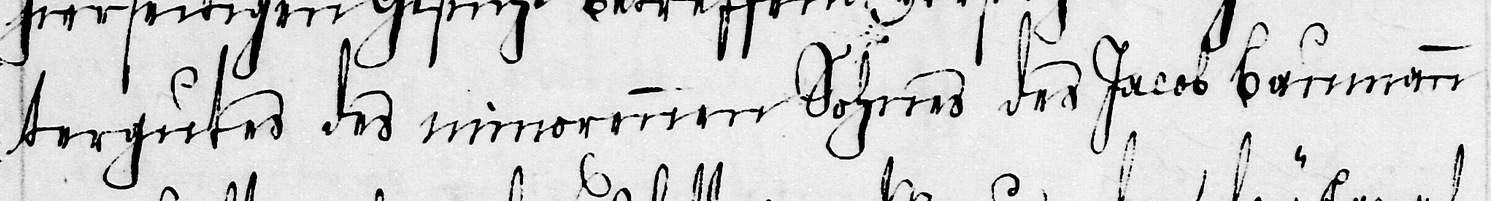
tergutes des minorennen Sohnes des Jacob Baumann
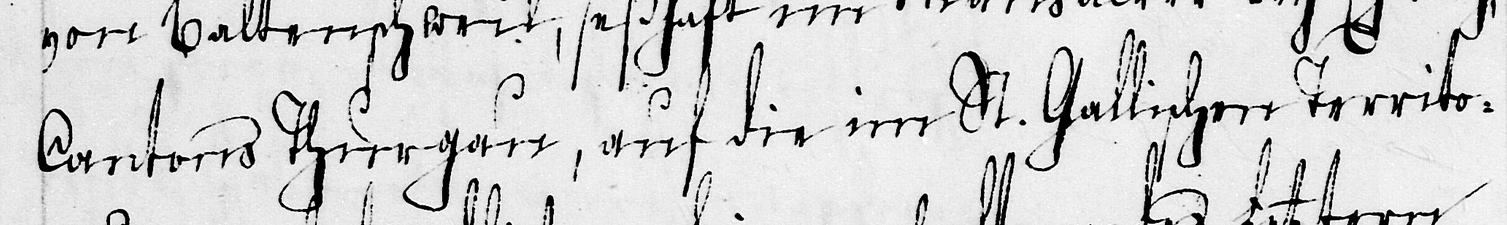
Cantons Thurgau, auf die im St. Gallischen Territo¬
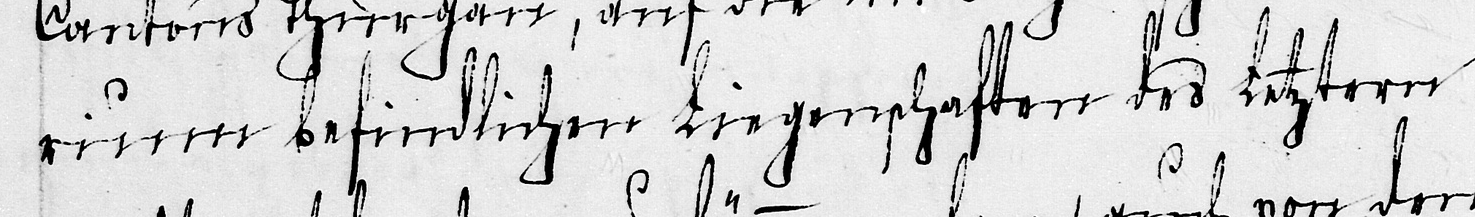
rium befindlichen Liegenschaften des Letztern
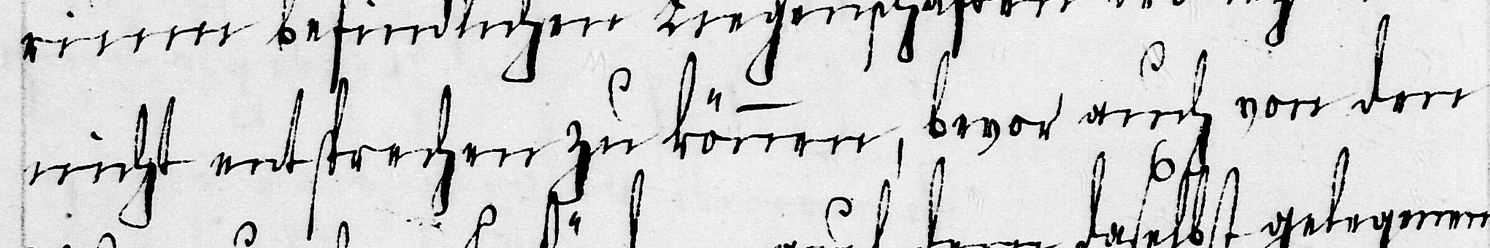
nicht entsprechen zu können, bevor auch von den
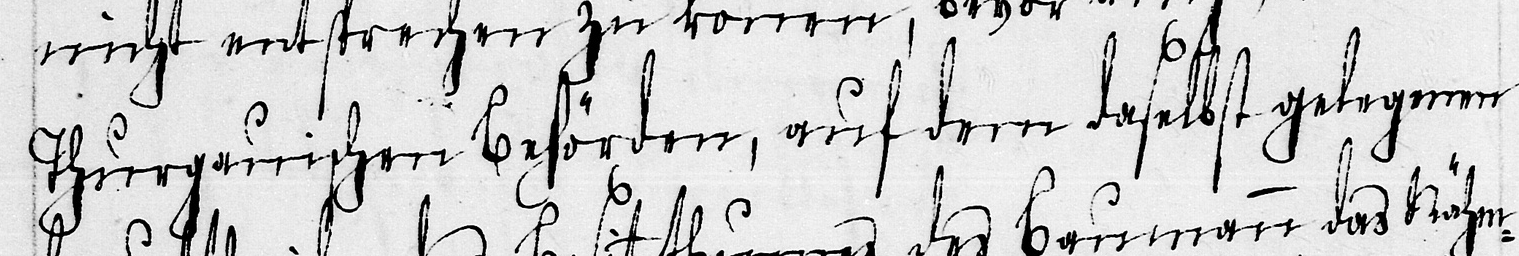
Thurgauischen Behörden, auf dem daselbst gelegenen
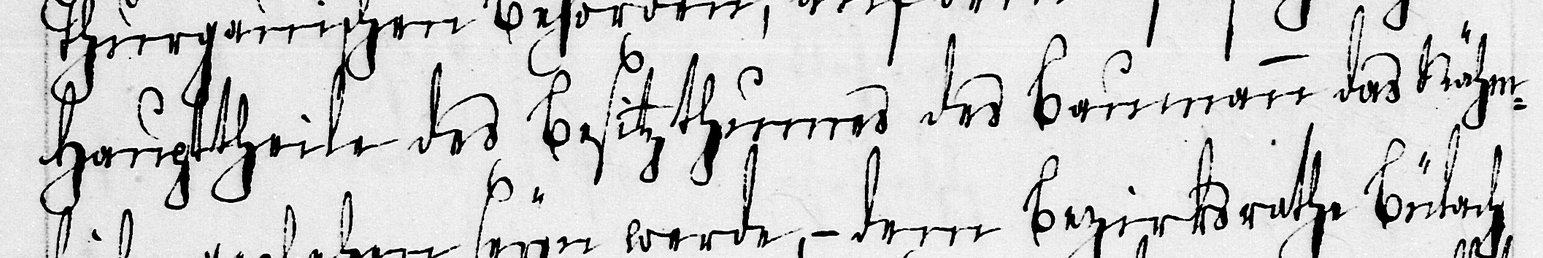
Haupttheile des Besitzthumes des Baumann das Nähm¬
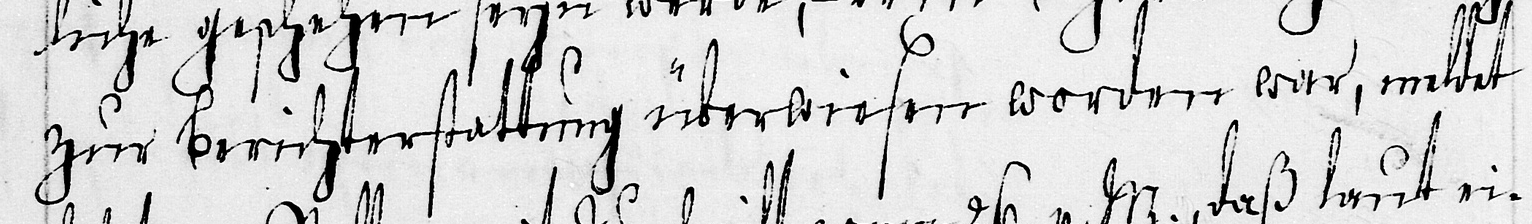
zur Berichterstattung überwiesen worden war, meldet
